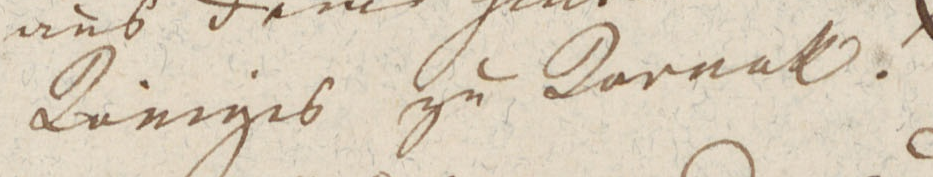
Königes zu Karnak. %
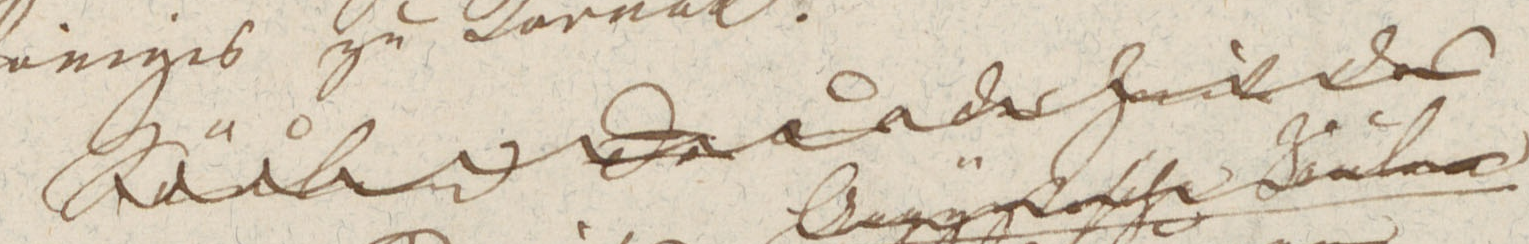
Säulen die aus der Zeit des
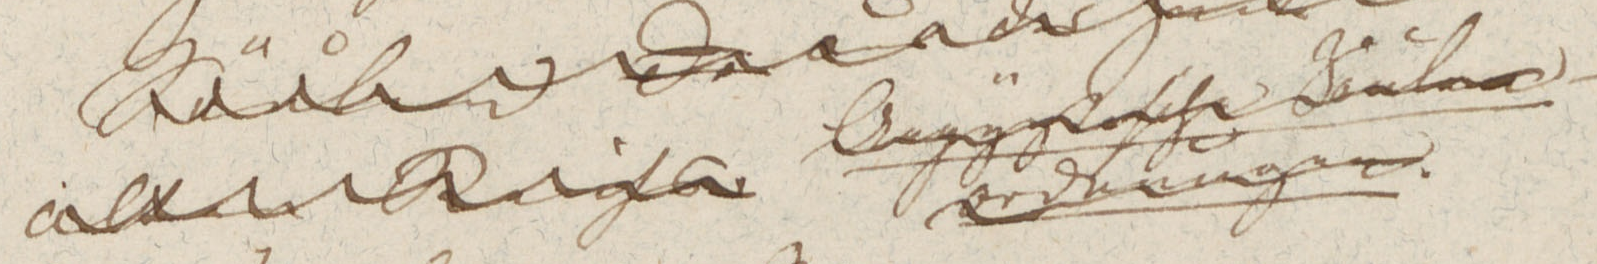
alten Reichs Aegyptische Säulen-
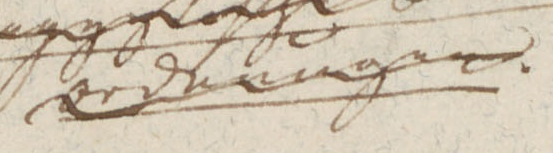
ordnungen.
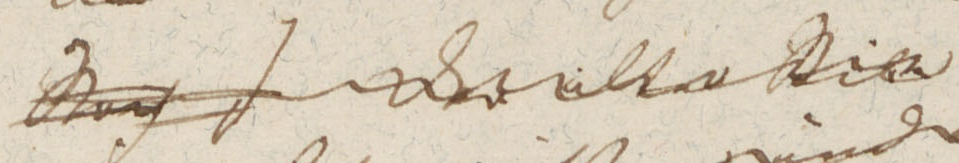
Noch I Der alte Stil
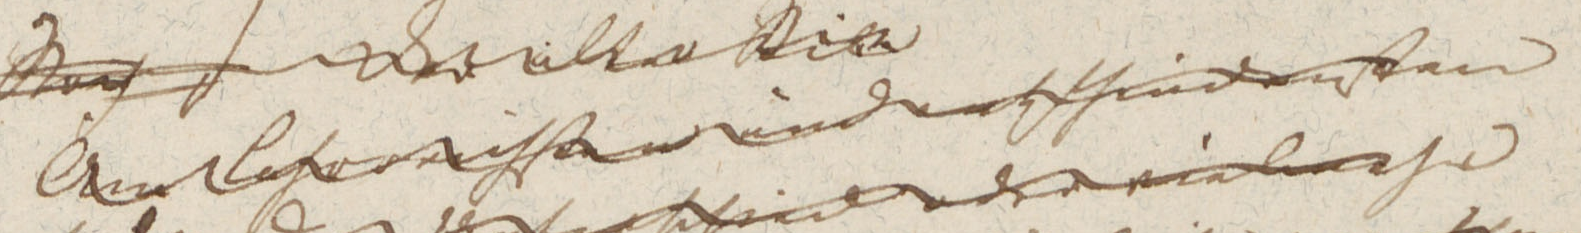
Am lehrreichsten und entschiedensten
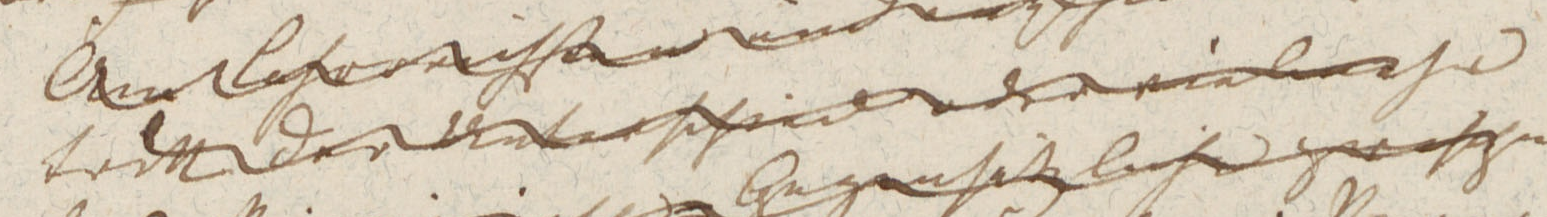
tritt der Unterschied oder vielmehr
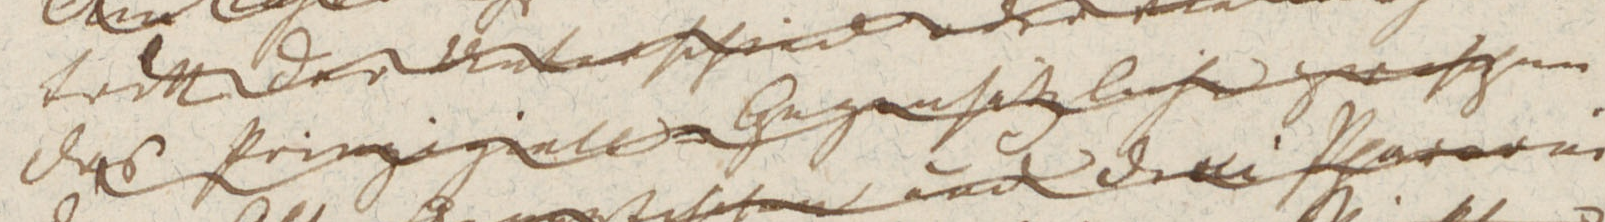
das Prinzipiell-Gegensätzliche zwischen
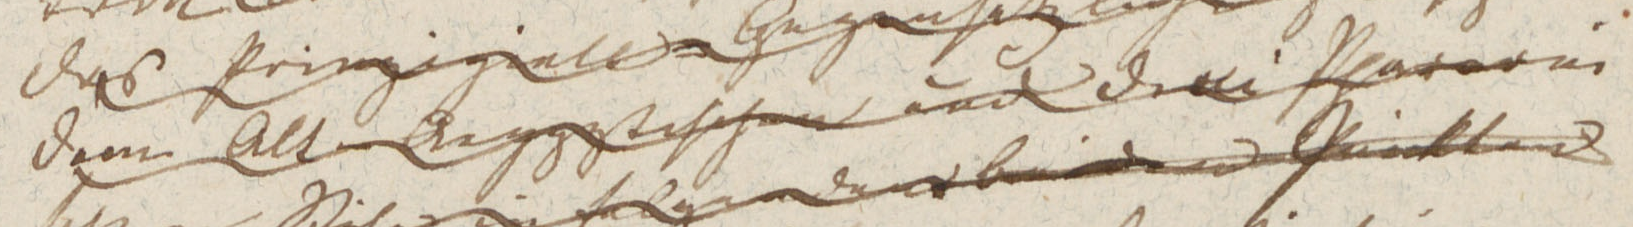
dem Alt-Aegyptischen und dem Phararoi
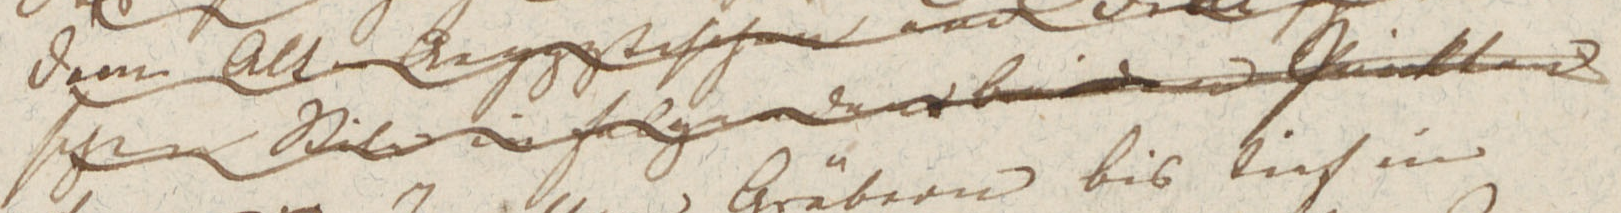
schen Stile in folgenden beiden Punkten
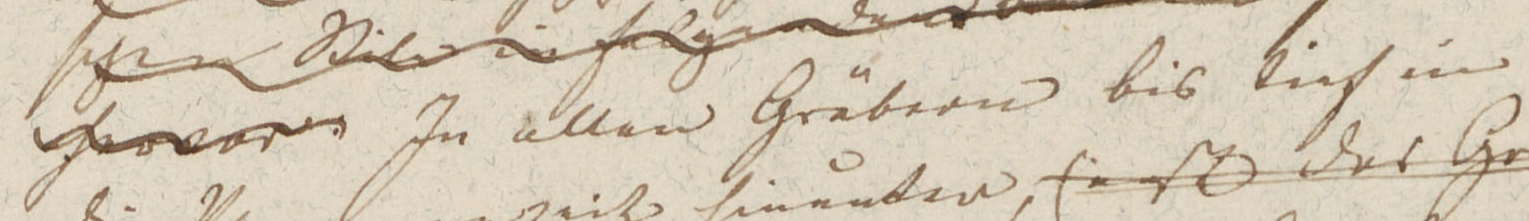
hervor In allen Gräbern bis tief in
